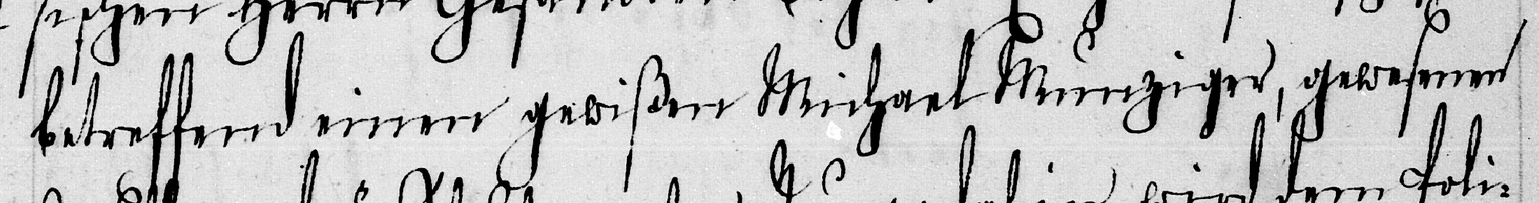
betreffend einen gewißen Michael Munziger, gewesenen
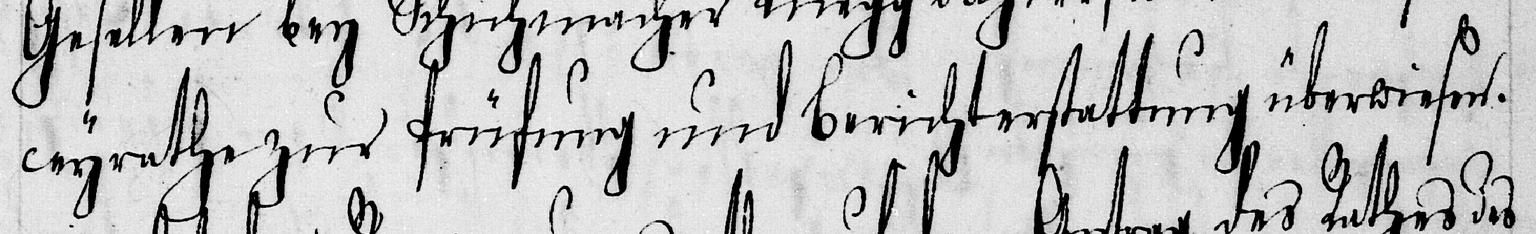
ceyrathe zur Prüfung und Berichterstattung überwiesen.
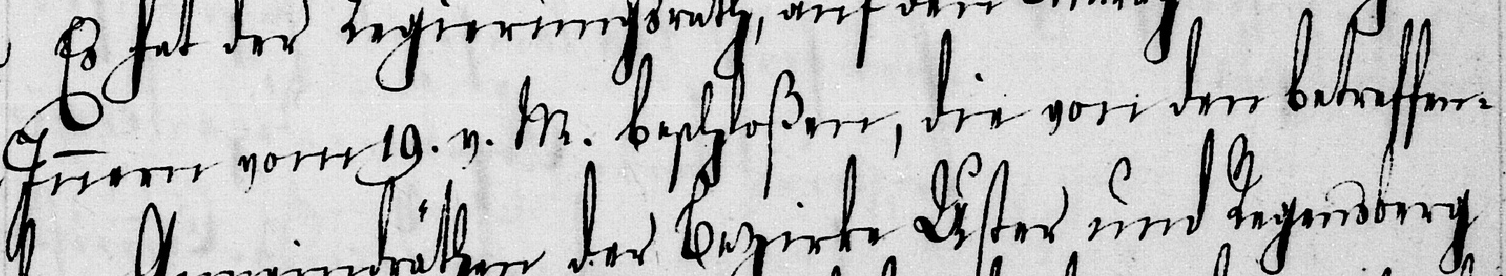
Innern vom 19. v. M. beschloßen, die von den betreffen¬
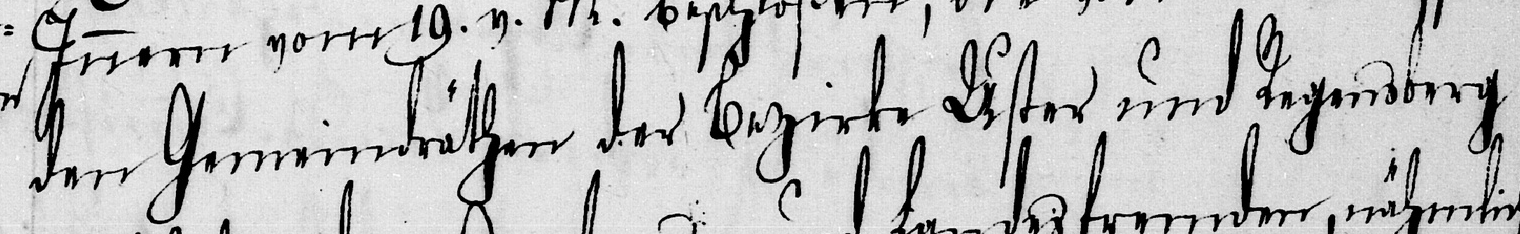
den Gemeindräthen der Bezirke Uster und Regensberg
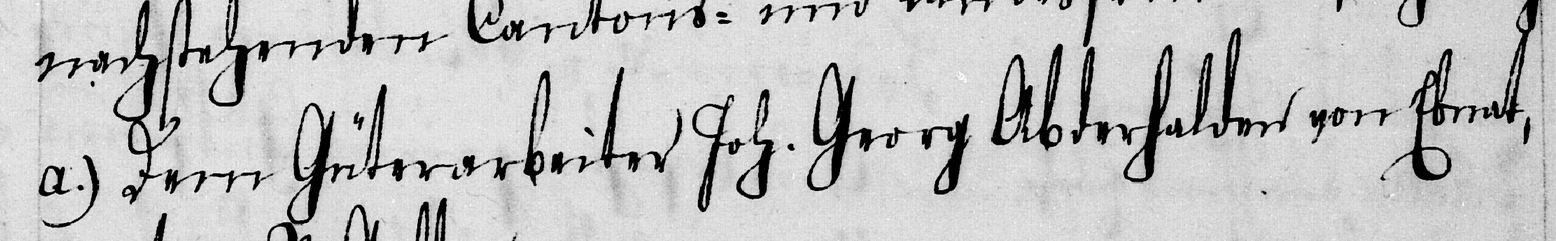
a.) Dem Güterarbeiter Joh. Georg Abderhalden von Ebnat,
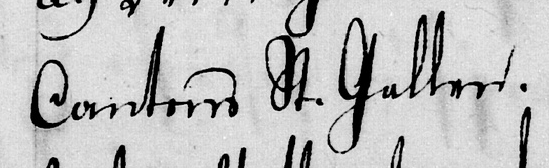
Cantons St. Gallen.
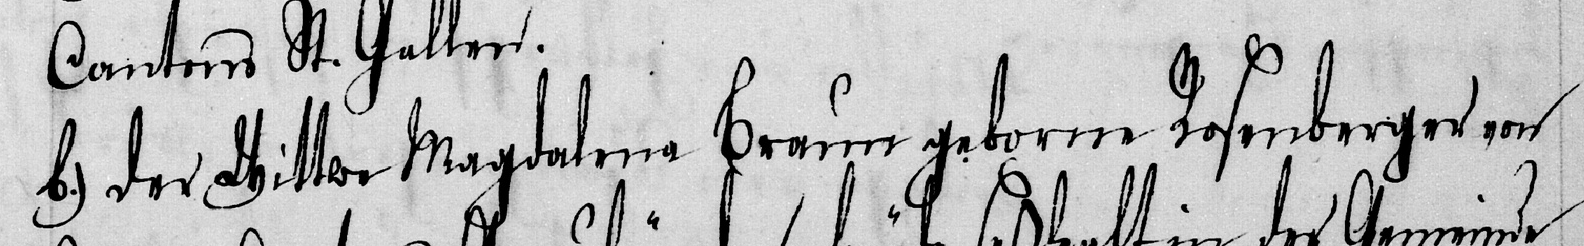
b.) der Wittwe Magdalena Braun geborne Rosenberger von
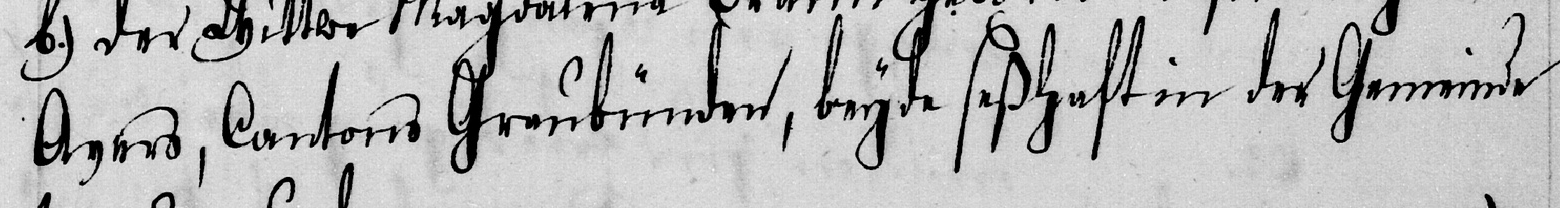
Avers, Cantons Graubünden, beyde seßhaft in der Gemeinde
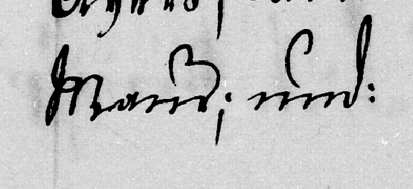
Maur; und:
